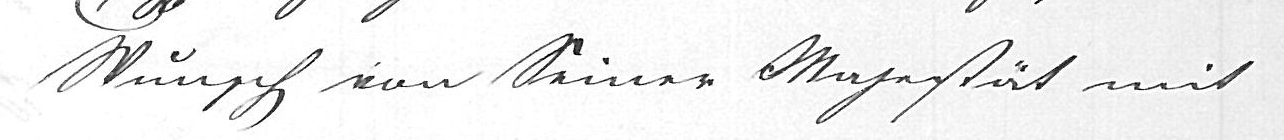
Wunsch von Seiner Majestät mit
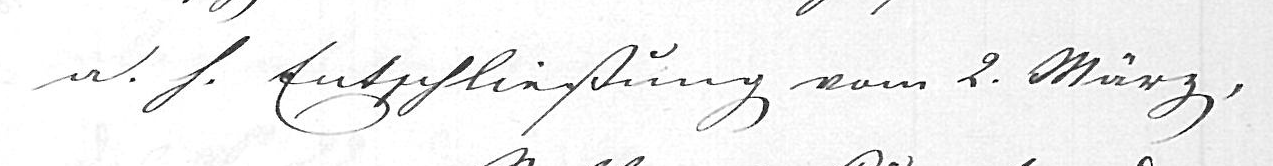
a.h. Entschließung vom 2. März
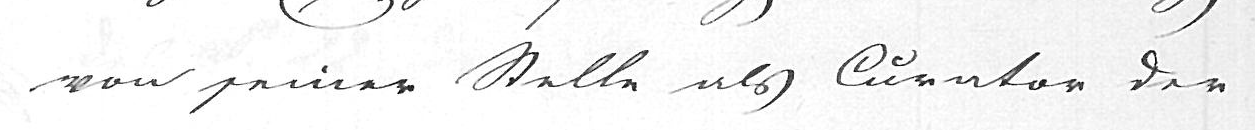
von seiner Stelle als Curator der
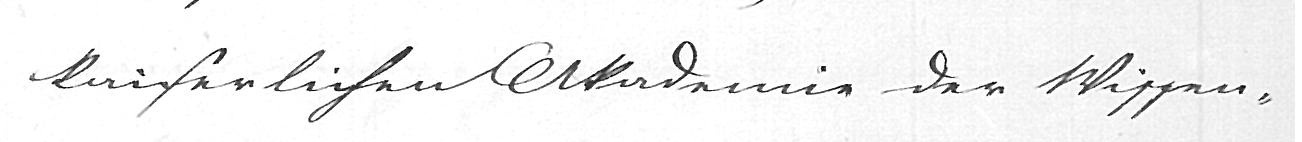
kaiserlichen Akademie der Wissen-
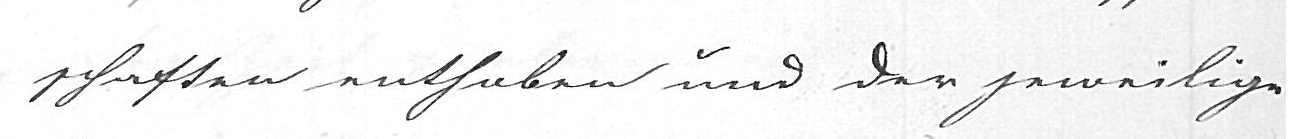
schaften enthoben und der jeweilige
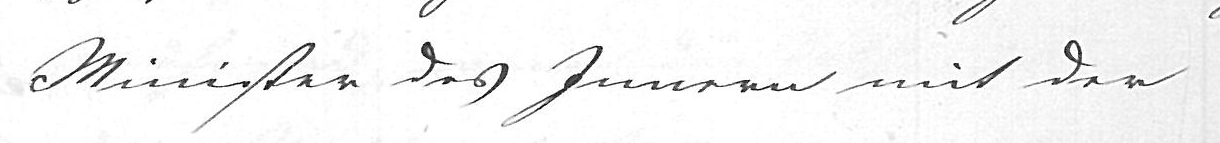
Minister des Innern mit der
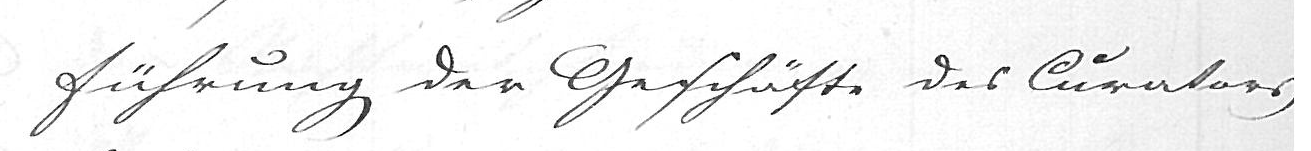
Führung der Geschäfte des Curators,
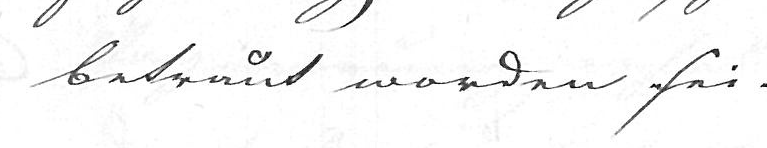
betraut worden sei.
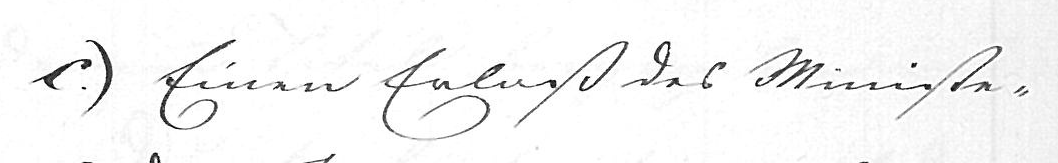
c) Einen Erlaß des Ministe-
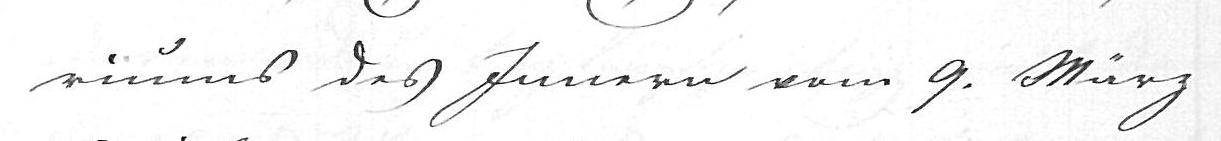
riums des Innern vom 9. März
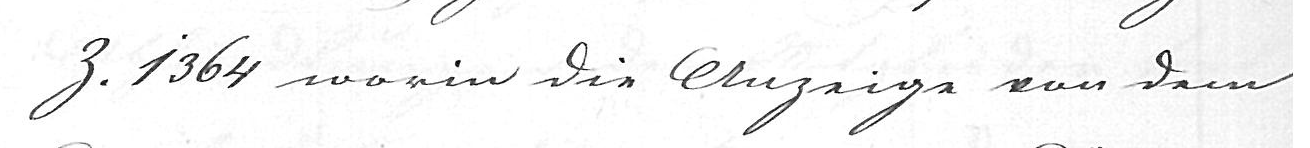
Z. 1364 worin die Anzeige von dem
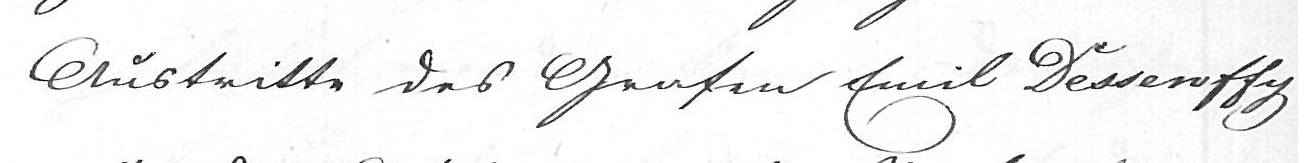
Austritte des Grafen Emil Dessewffy
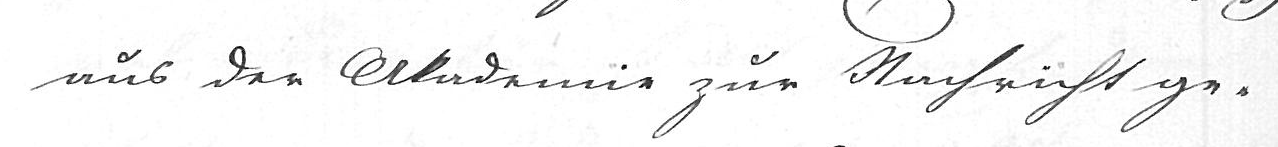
aus der Akademie zur Nachricht ge-
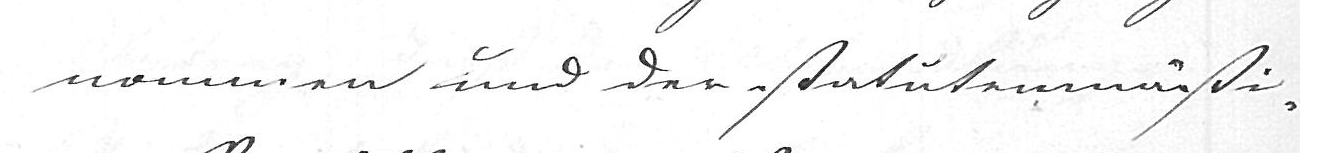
nommen und der statutenmäßi-
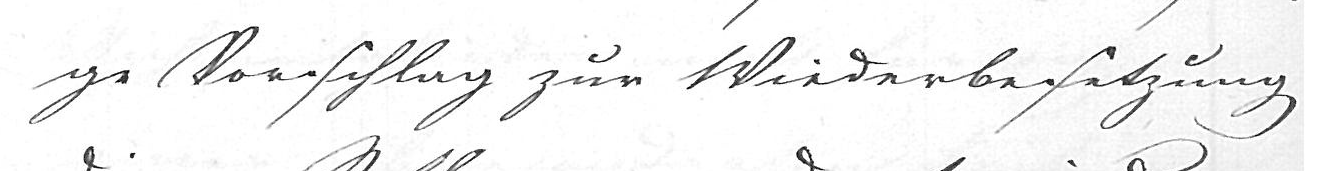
ge Vorschlag zur Wiederbesetzung
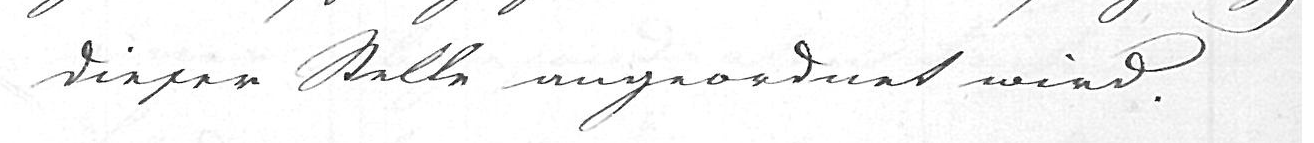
dieser Stelle angeordnet wird
